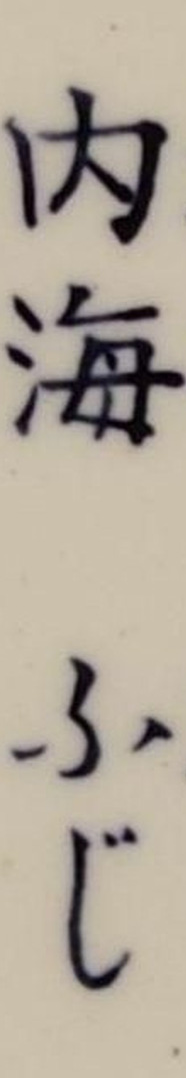内海ふじ
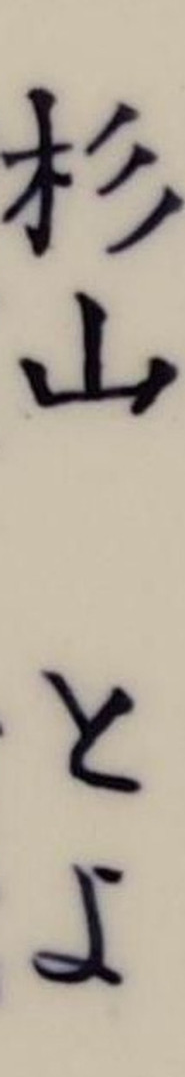杉山とよ
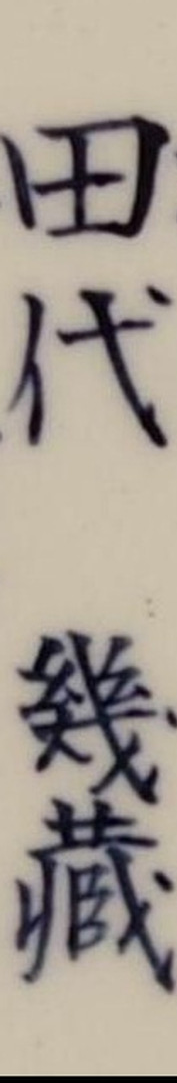田代幾蔵
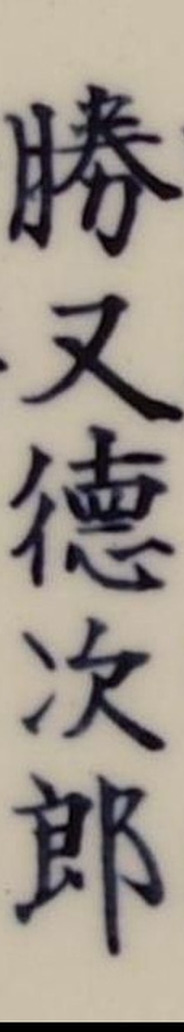勝又徳次郎
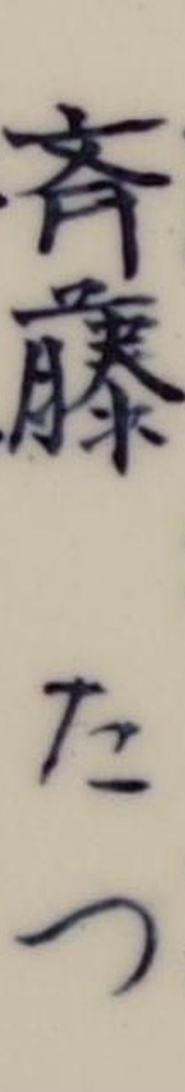斉藤たつ
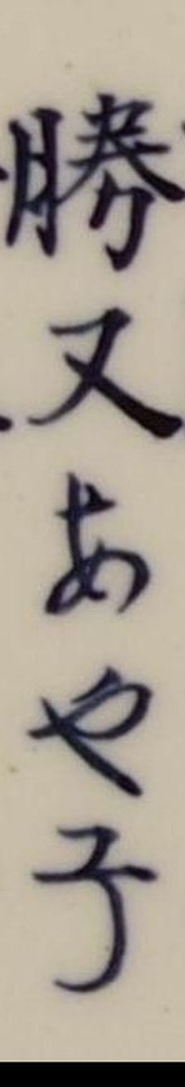勝又あや子
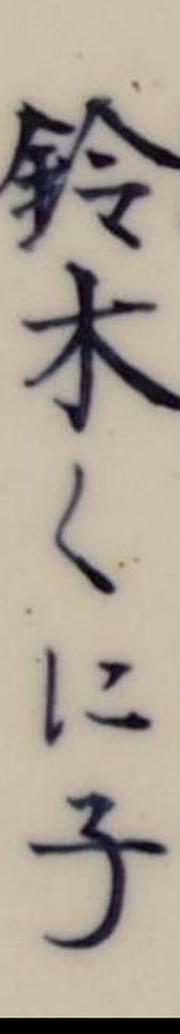鈴木くに子
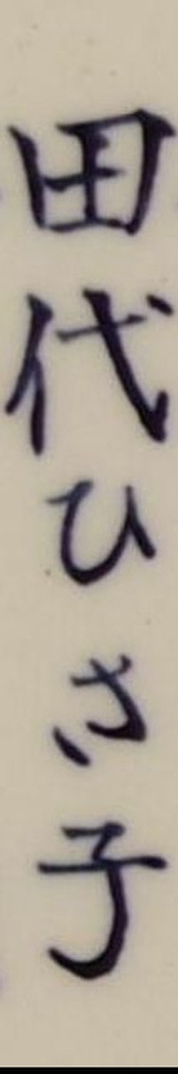田代ひさ子
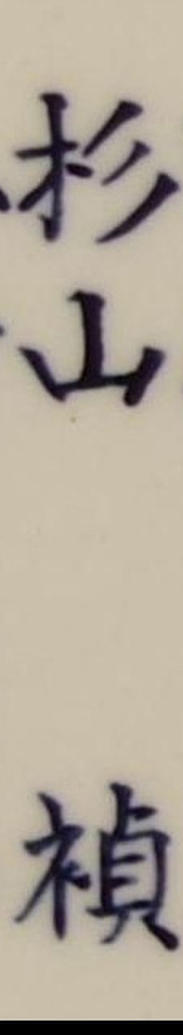杉山禎
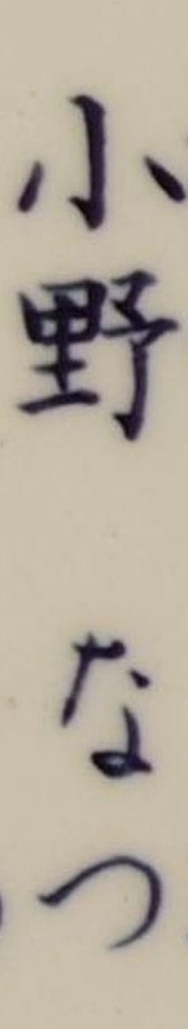小野なつ
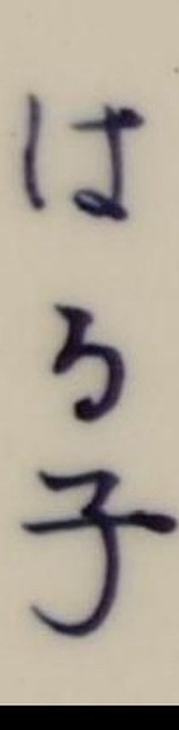はる子

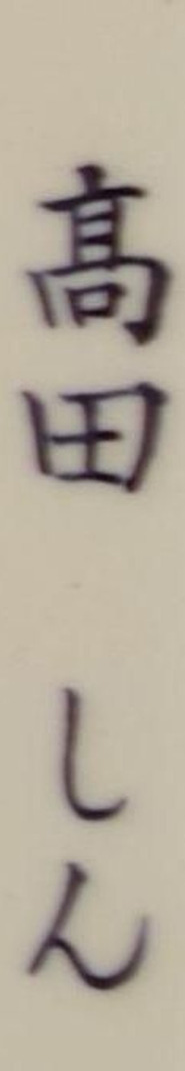高田しん
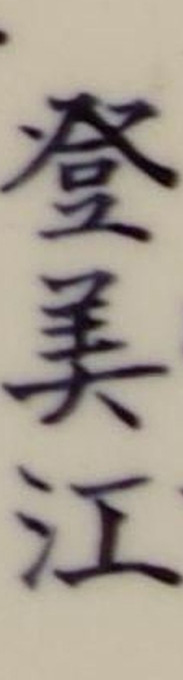登美江
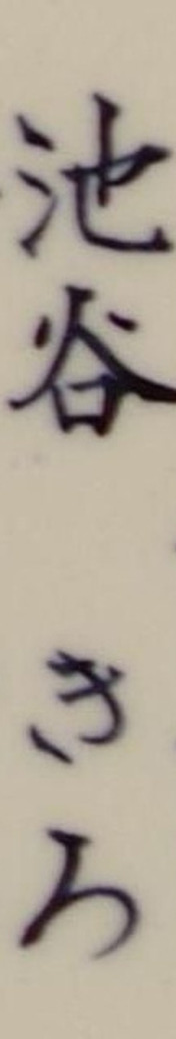池谷きろ
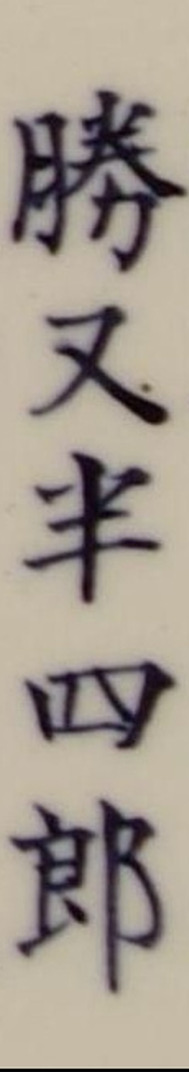勝又半四郎
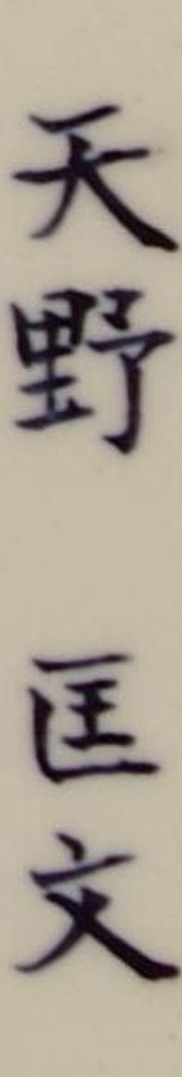天野匡文
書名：E~L
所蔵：高野山金剛峯寺
